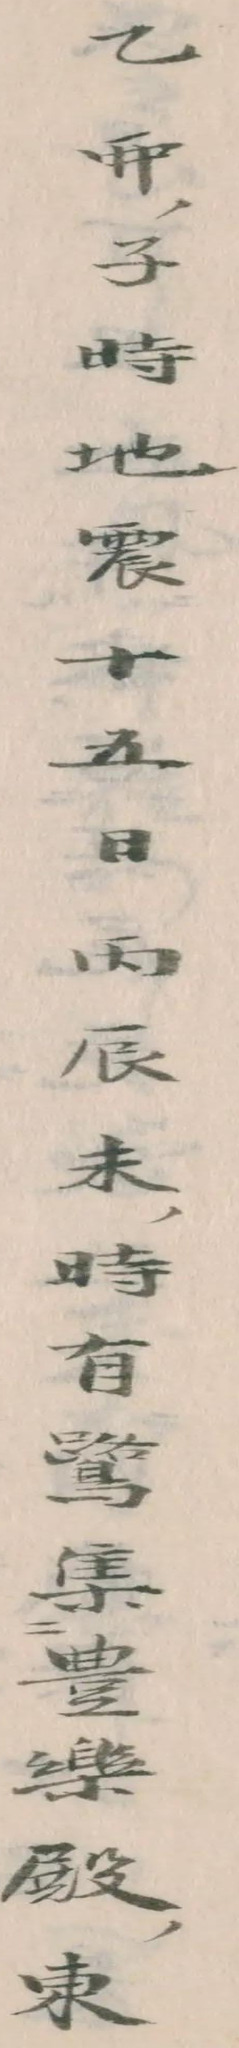乙卯子時地震十五日丙辰未時有鷺集豊楽殿東
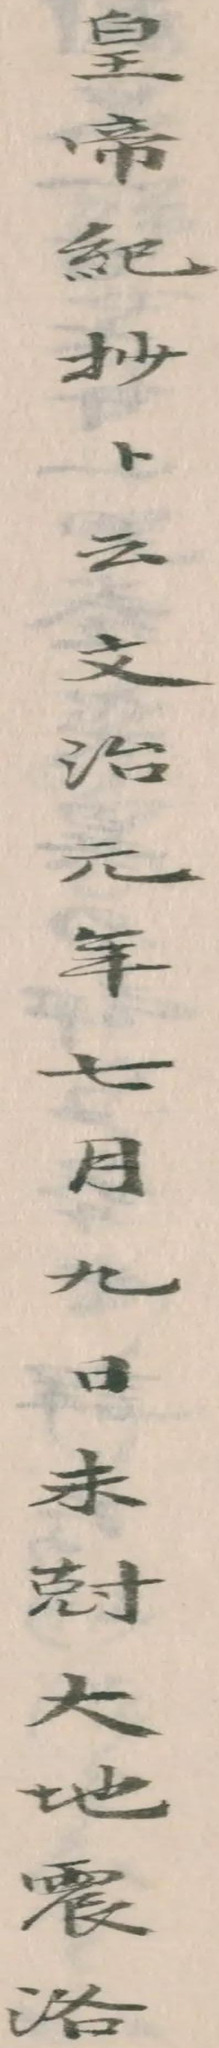皇帝紀抄ト云文治元年七月九日未尅大地震洛
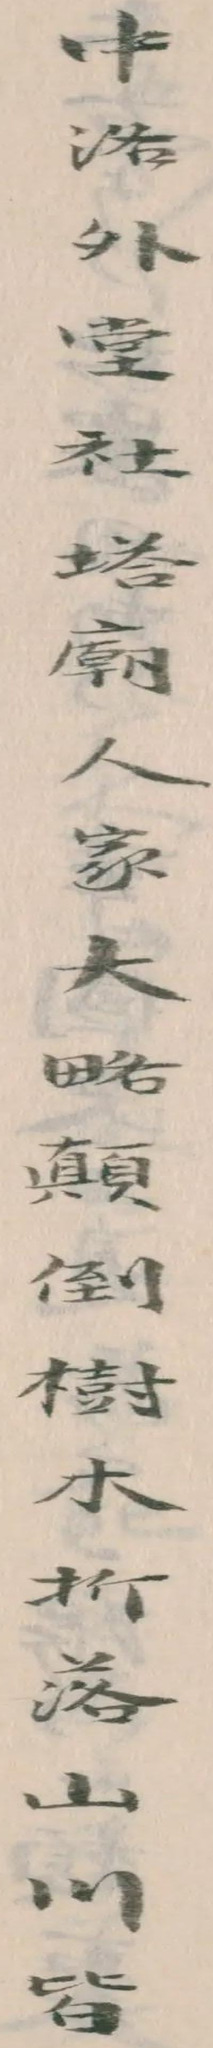中洛外堂社塔廟人家大略顛倒樹木折落山川皆
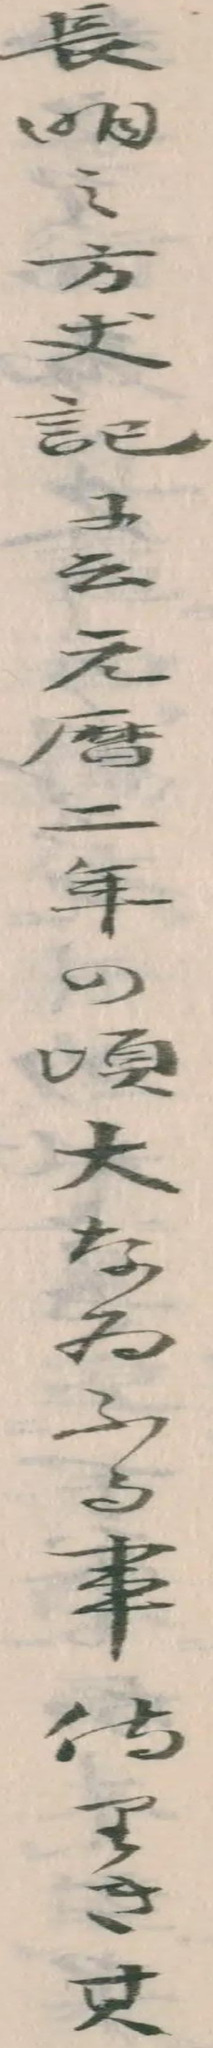長明之方丈記に云元暦二年の頃大なゐふる事侍りき其
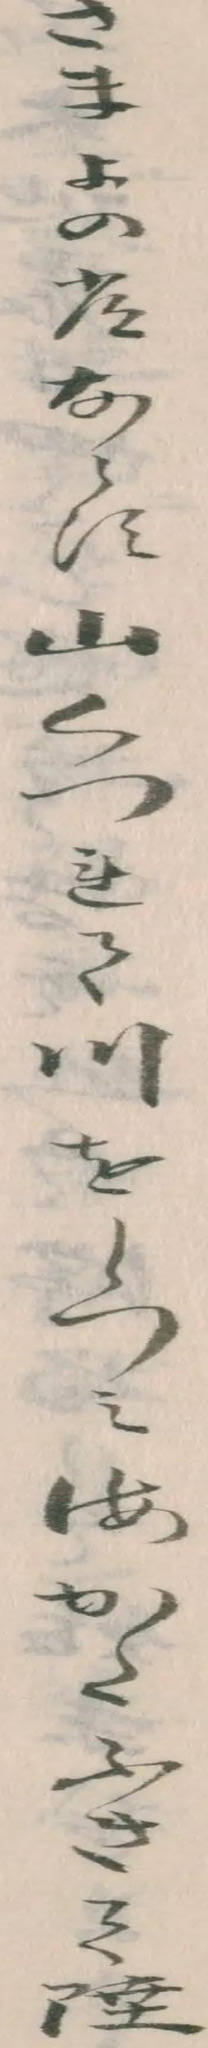さまよの常ならす山くつれて川をしつみ海かたふきて陸
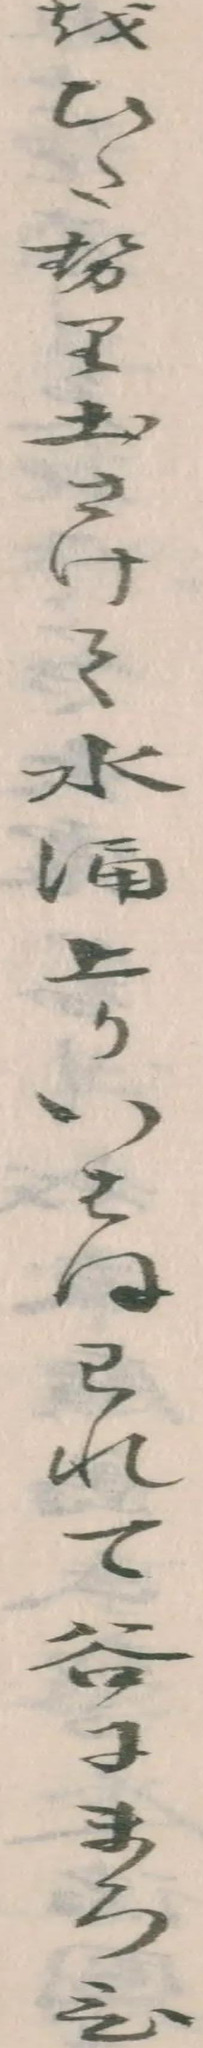をひたせり土さけて水湧上りいはほわれて谷にまろひ
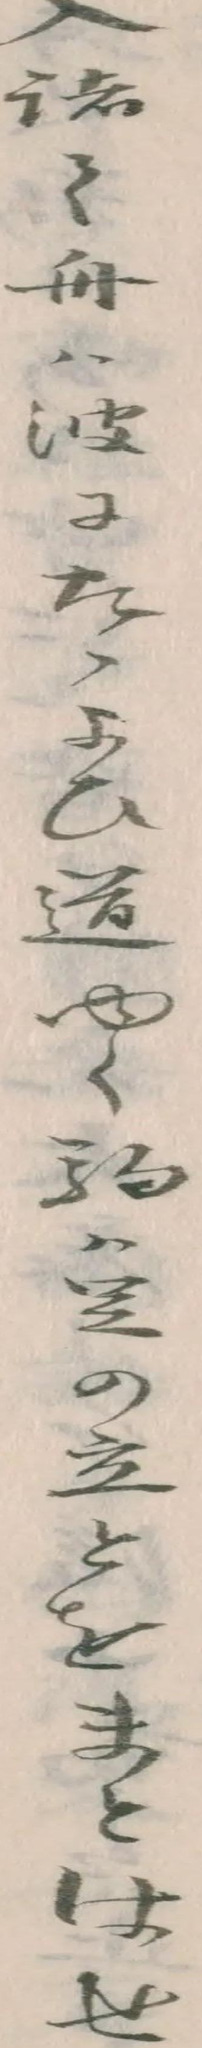入諸て舟は波にたゝよひ道ゆく駒は足の立とをまとはせ
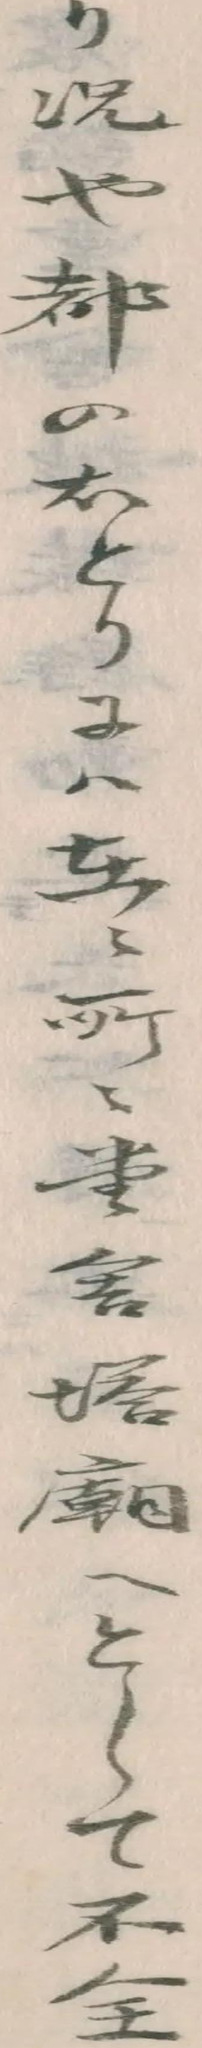り況や都のほとりには在々所々堂舎塔廟一として不全
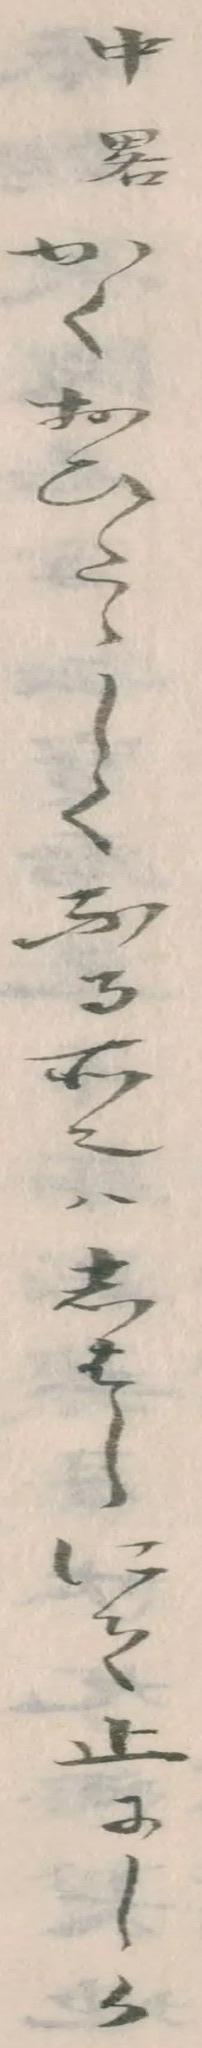中略かくおひたゝしくふる所也はしばしにて止にしか
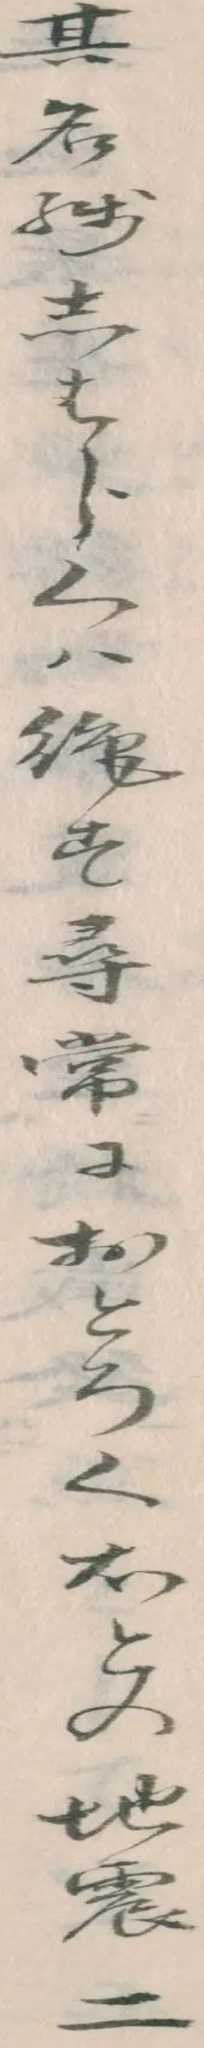其名残しはらくは絶す尋常におとろくほとの地震二
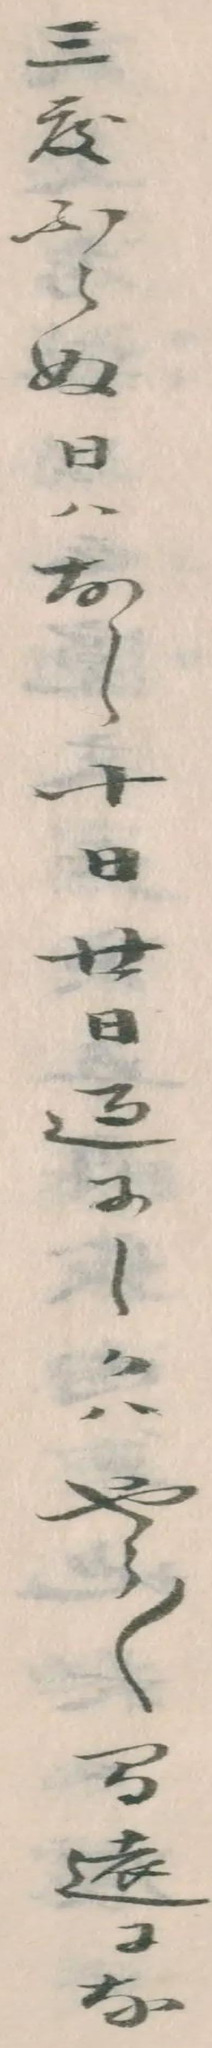三度ふらぬ日はなし十日廿日過にしかはやう〳〵間遠にな
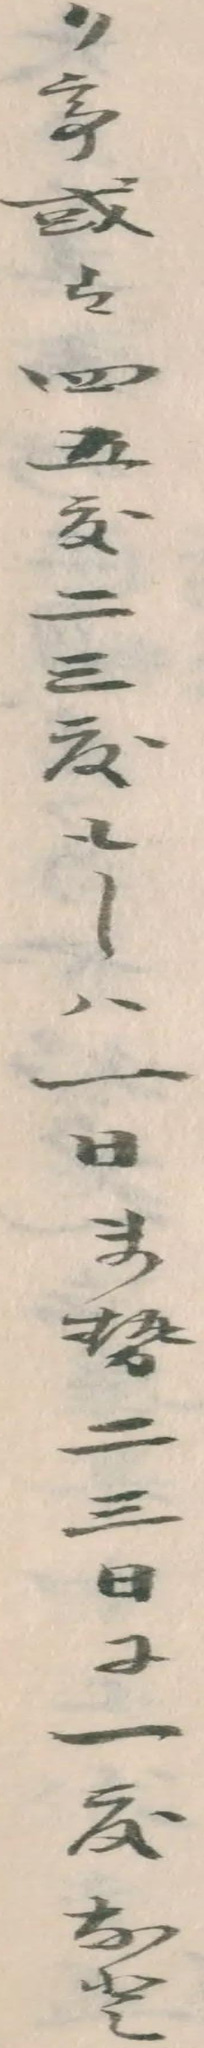り或は四五度二三度もしは一日ませ二三日に一度なと

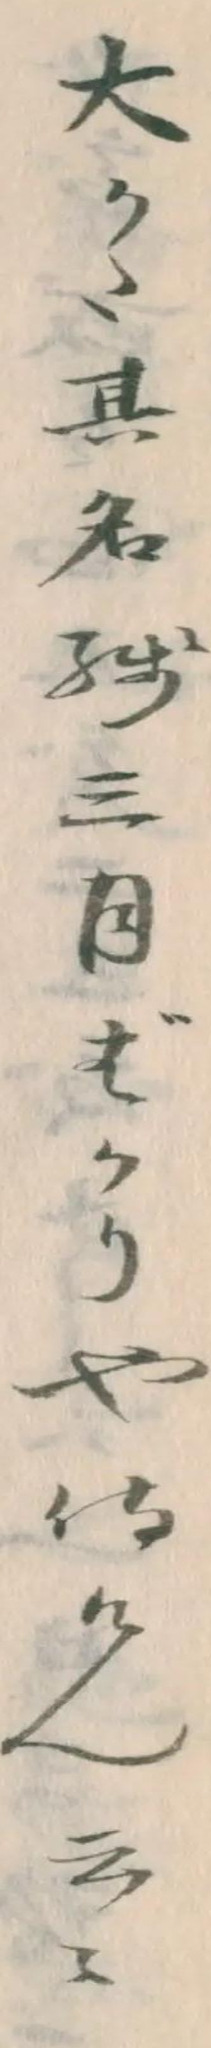大かた其名残三月ばかりや侍けん云々
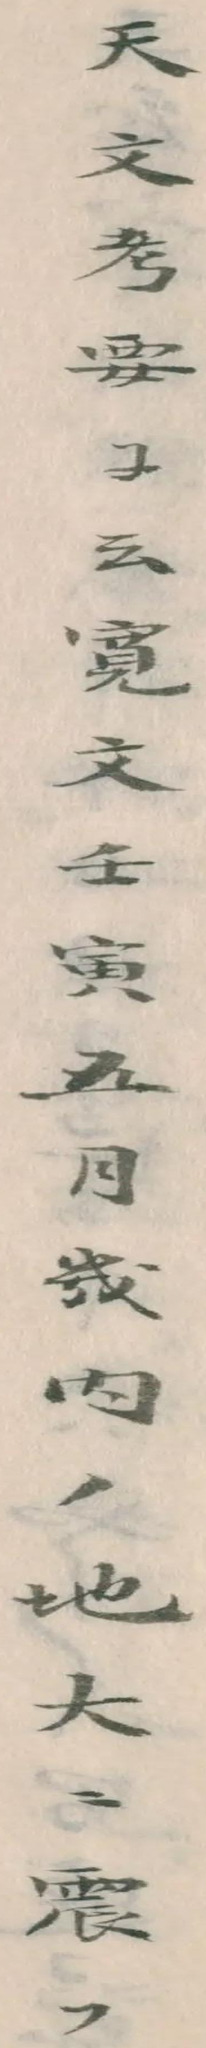天文考要に云寛文壬寅五月幾内ノ地大ニ震フ
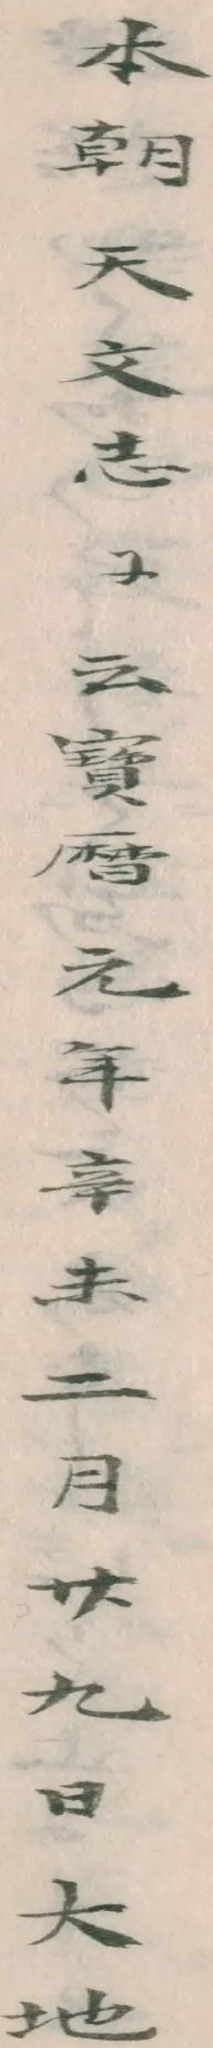本朝天文志に云宝暦元年辛未二月廿九日大地
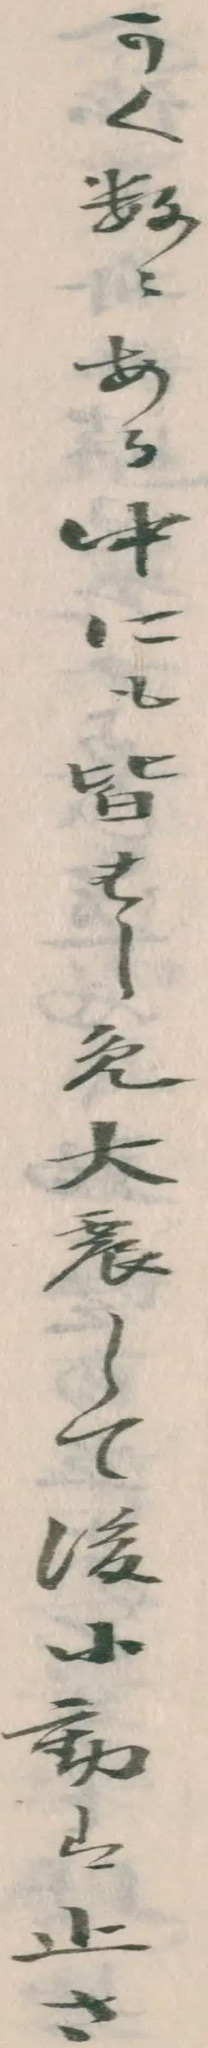かく数々ある中にも皆はしめ大震して後小動は止さ
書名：地災撮要. 巻11-12(地震之部)
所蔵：国立国会図書館 National Diet Library, JAPAN
